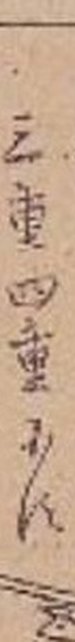三重四重にす
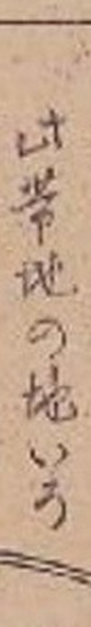此帯地の地いろ
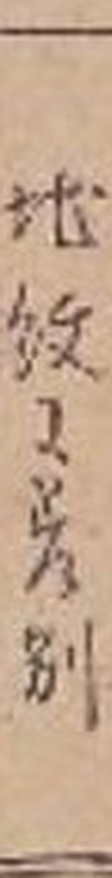地紋に差別
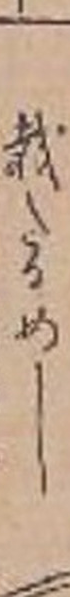載たるめし
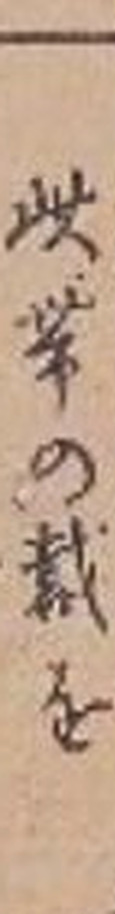此帯の戴を
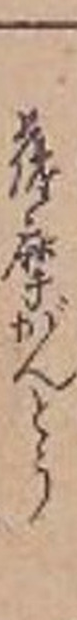薩摩がんとう
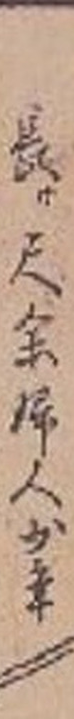長さ尺余婦人少年
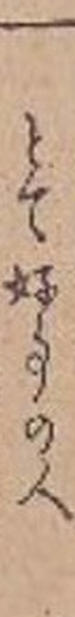とて好事の人
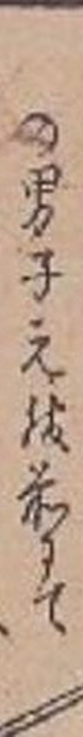の男子元服前にて
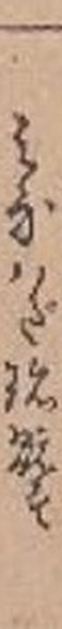みなはだ珍翫す
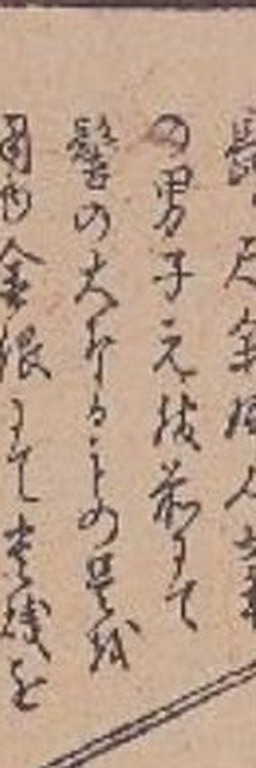髻の大なるもの是を
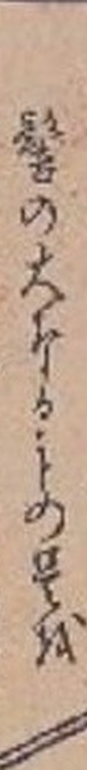髻の大なるもの是を
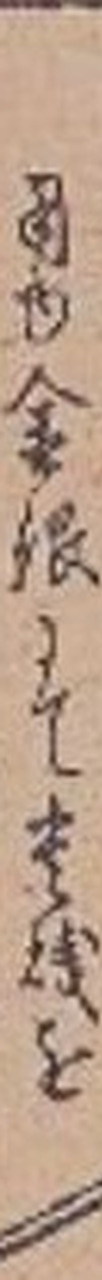用ゆ金銀にて貴賎を
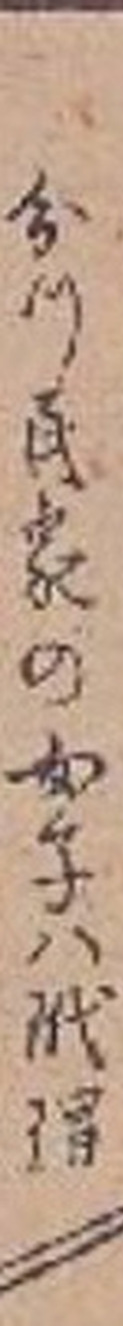分つ民家の女子は附帽
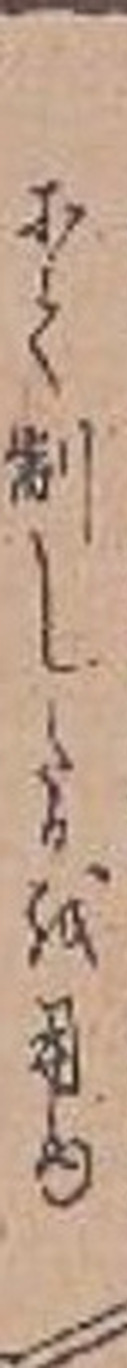にて制したるを用ゆ

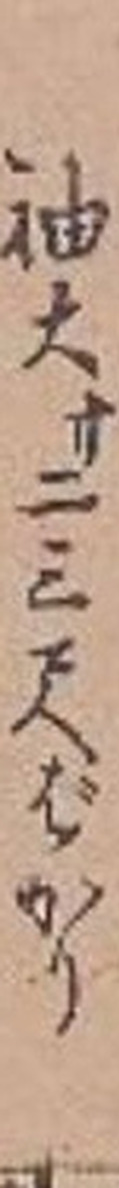袖大さ二三尺ばかり
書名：琉球談
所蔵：University of the Ryukyus Library
